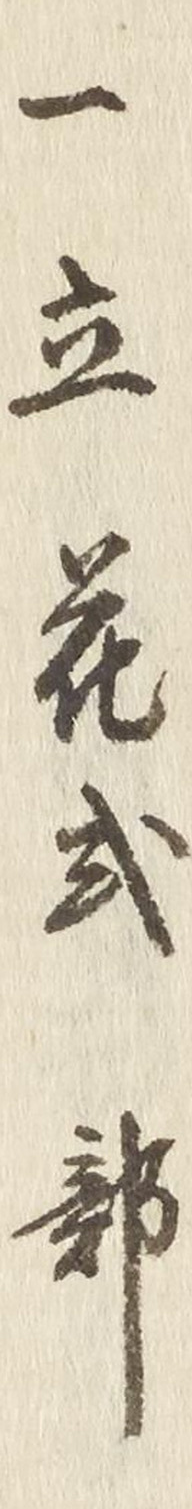一立花式部
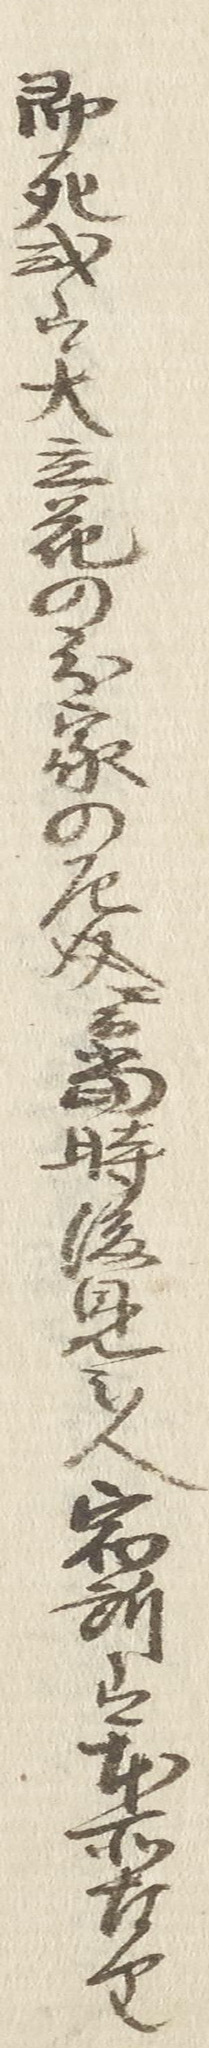即死或は大立花の分家の厄介ニ而当時後見之人宿所は本所なり
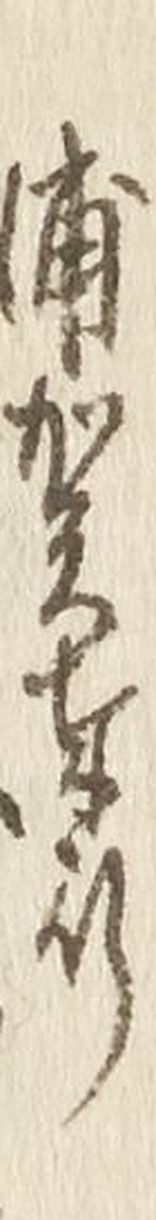浦賀奉行
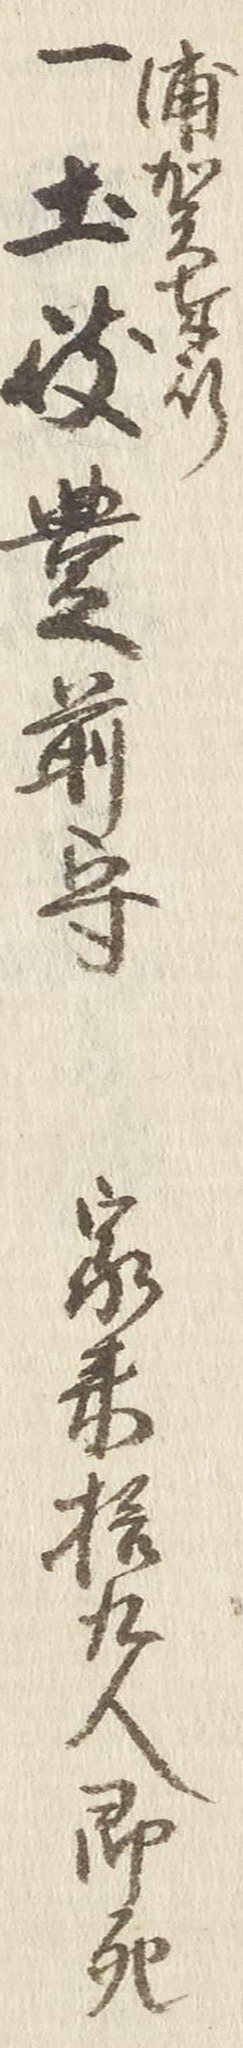一土岐豊前守家来拾九人即死
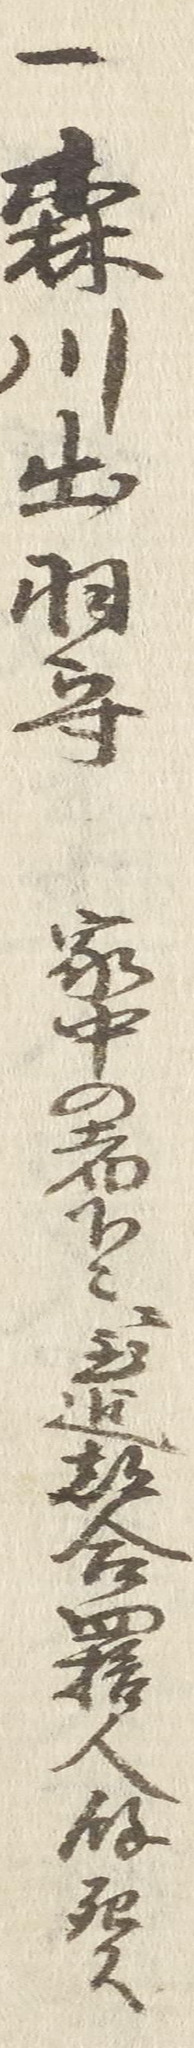一森川出羽守家中の者下々ニ至迄都合四拾人余り死ス
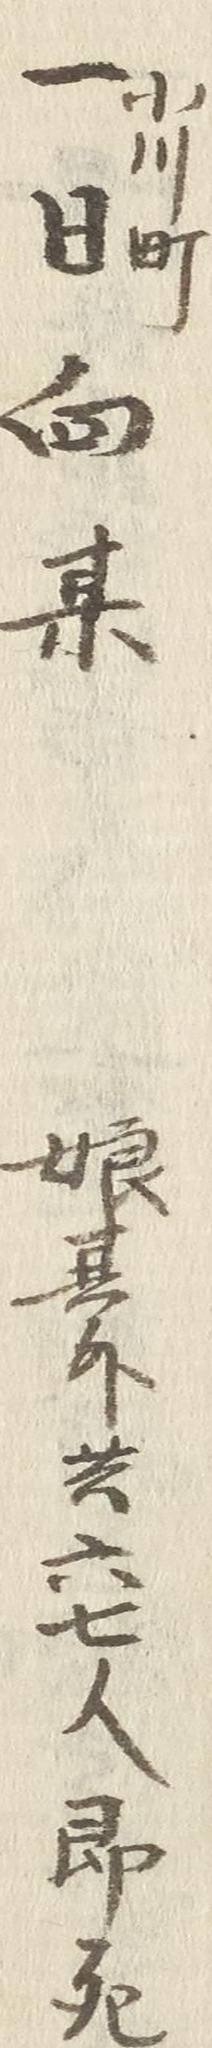一日向某娘其外共六七人即死

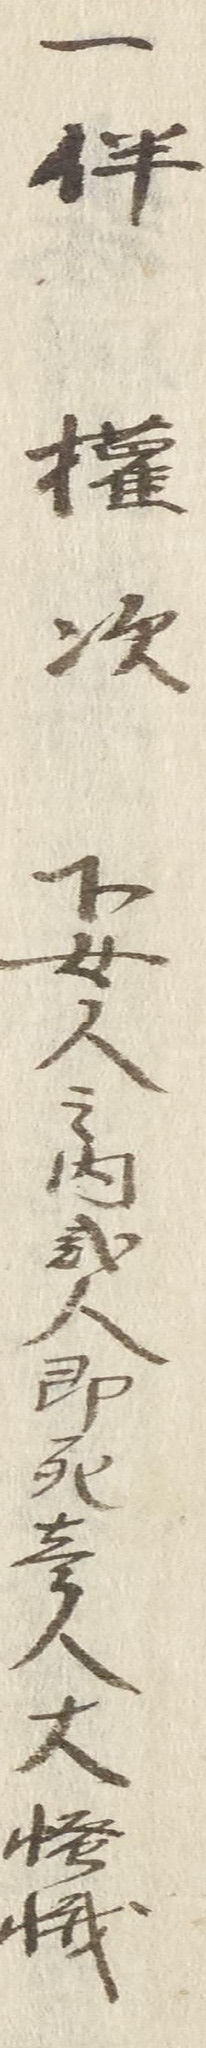一伴権次下女人之内弐人即死壱人大怪我
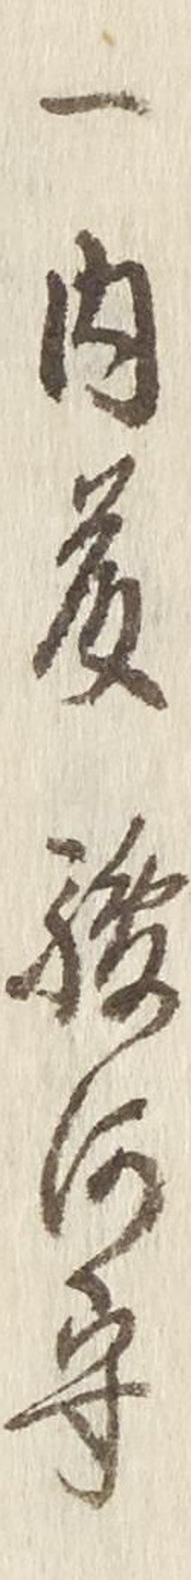一内藤駿河守
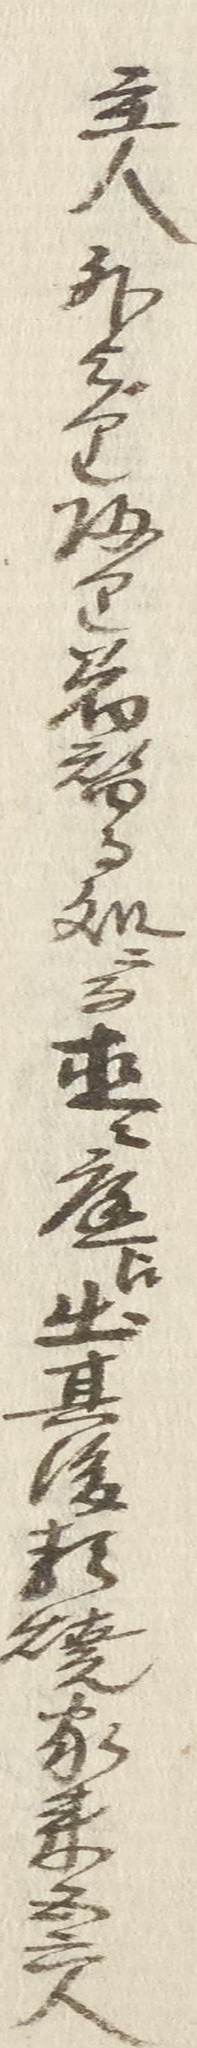主人外より帰り着替る処ニ而直ニ庭江出其後類焼家来五六人
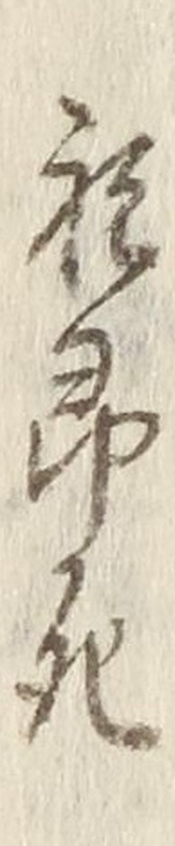程即死
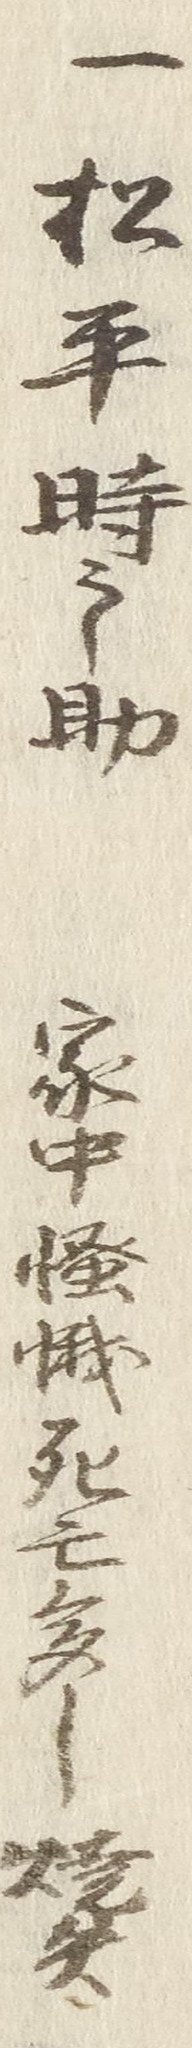一松平時之助家中怪我死亡多し焼失
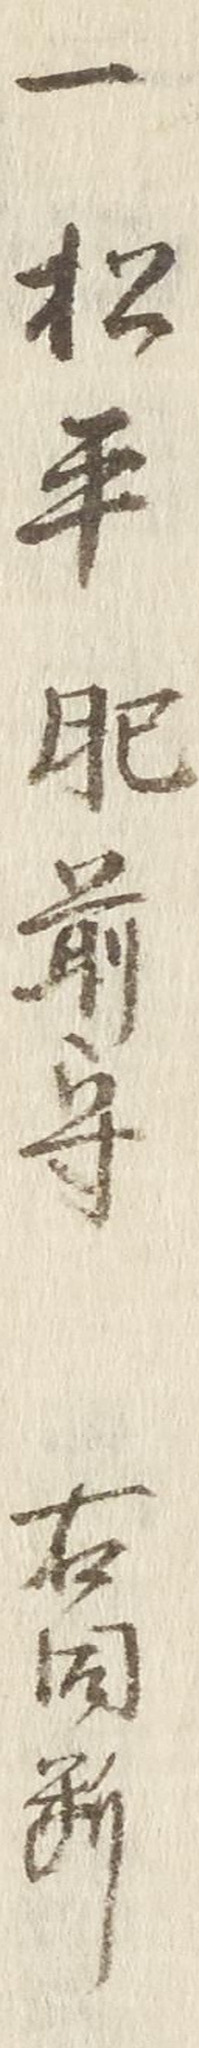一松平肥前守右同断同
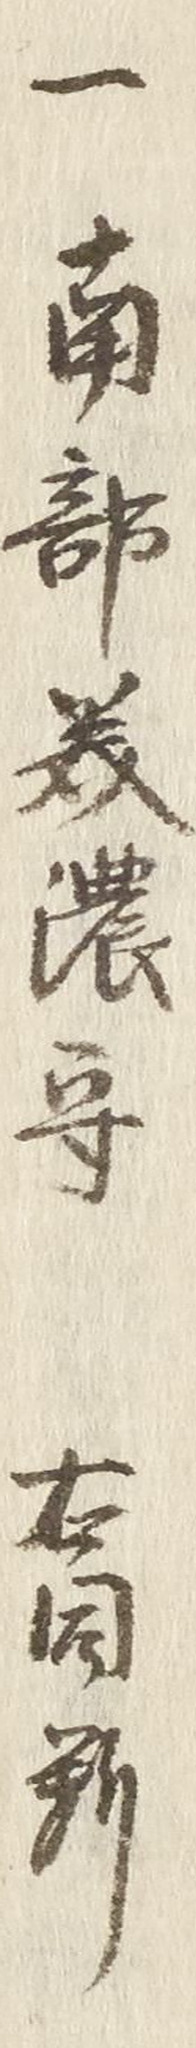一南部美濃守右同断同
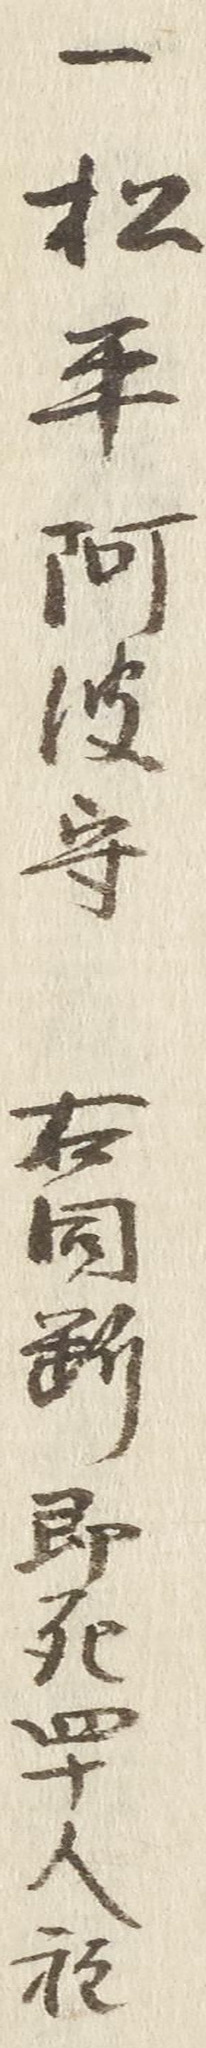一松平阿波守右同断即死四十人程
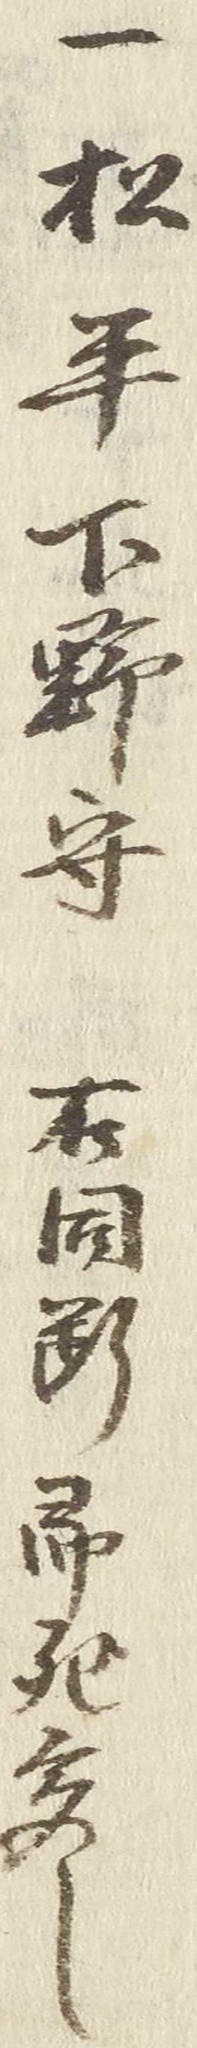一松平下野守右同断即死多し
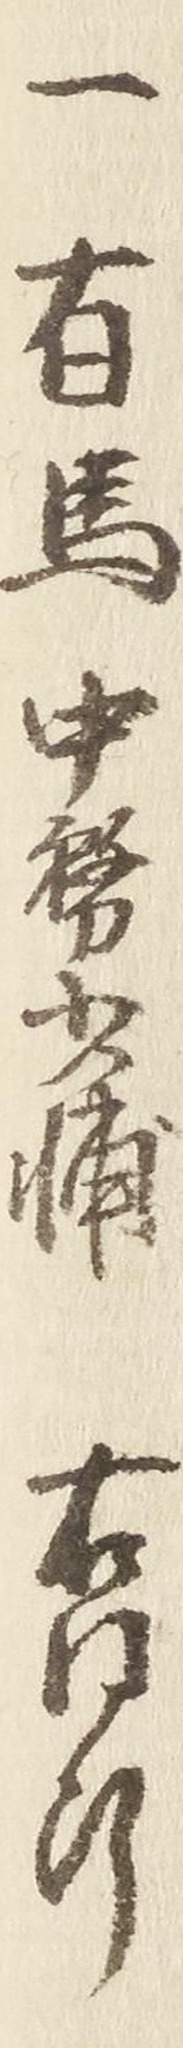一有馬中務少輔右同断
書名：従往古地震御届書記誌之一
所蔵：東京大学地震研究所図書室 Earthquake Research Institute Library, The University of Tokyo, JAPAN
